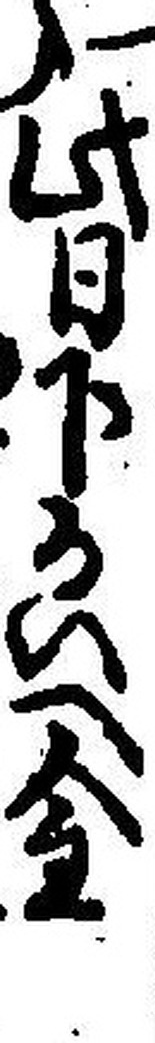此日下かいへ金
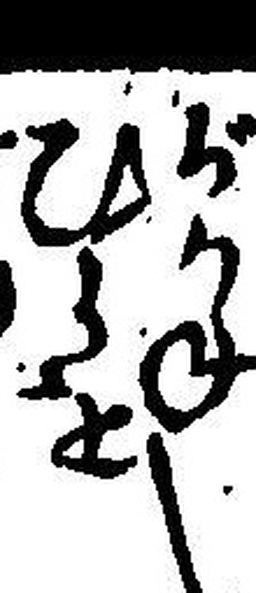ひらを
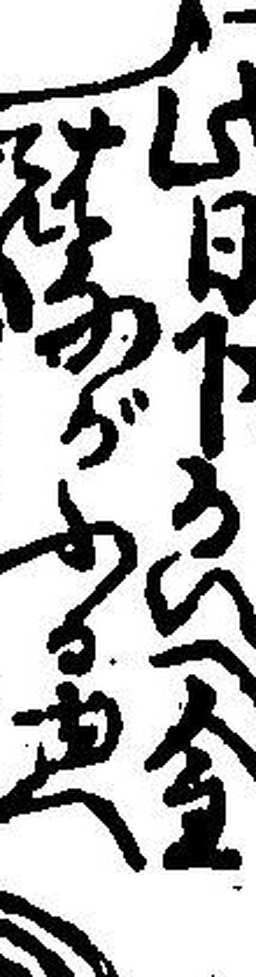はながふるゆへ
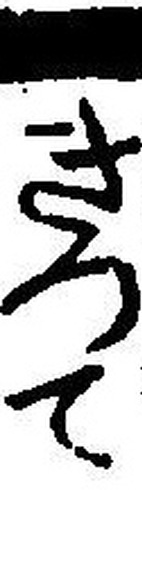きつて
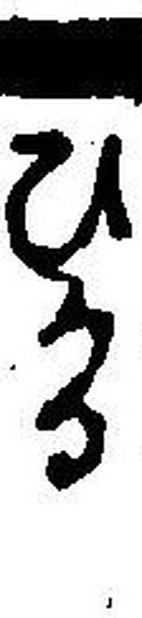ひかる
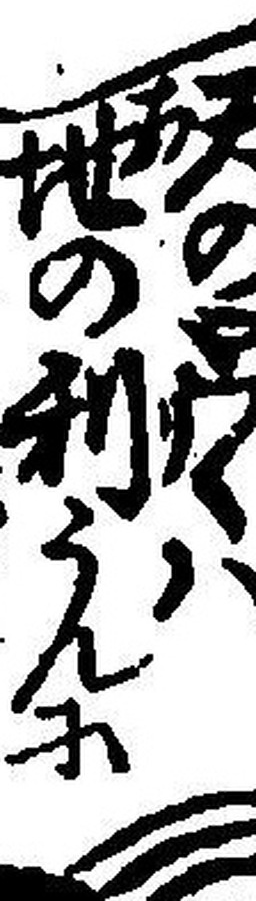地の利うんに
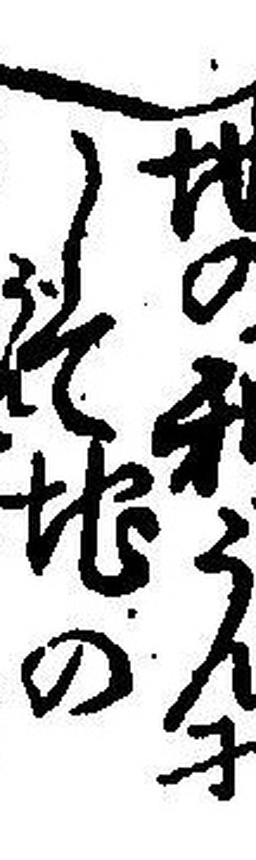して地の
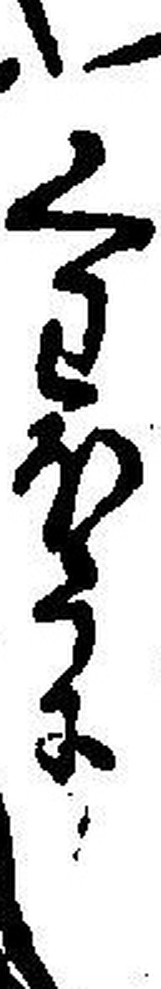くわほうに
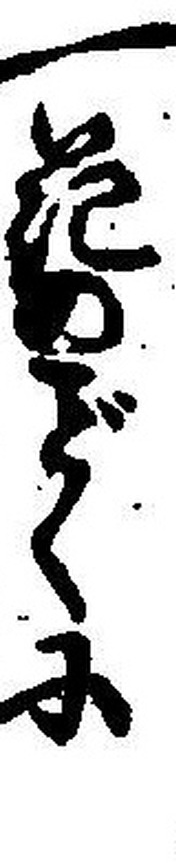花のごとくに
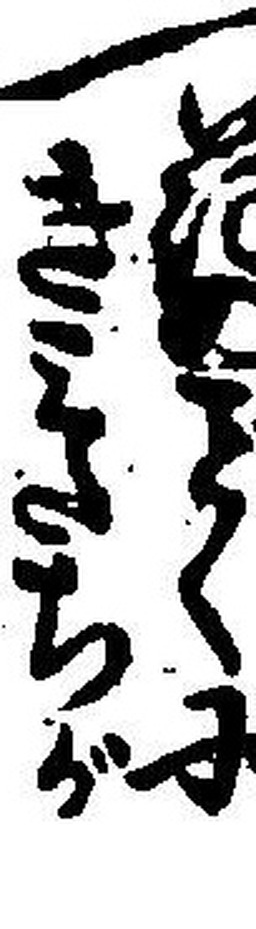きみたちが
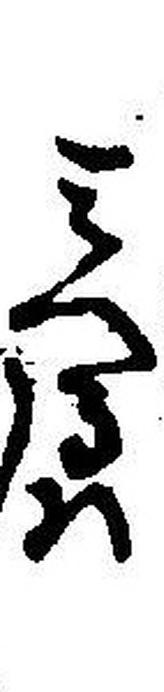みへるは
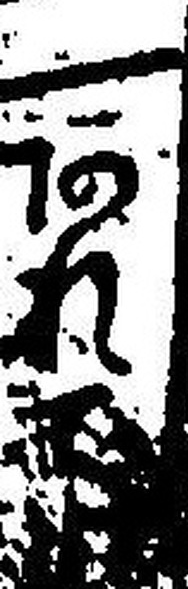あれて
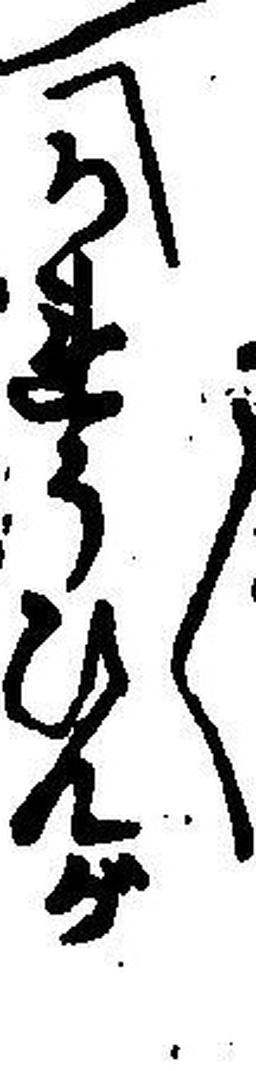〽かれうひんが
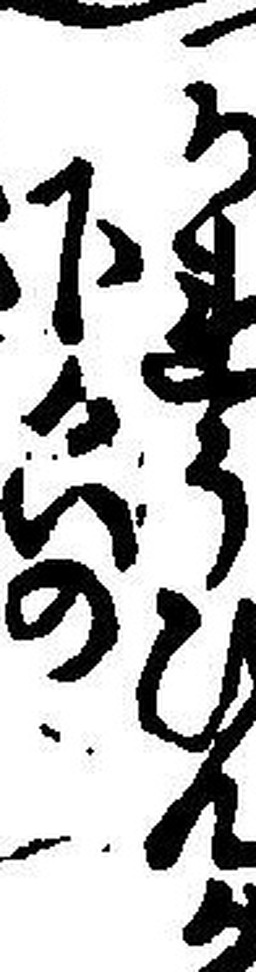下かいの
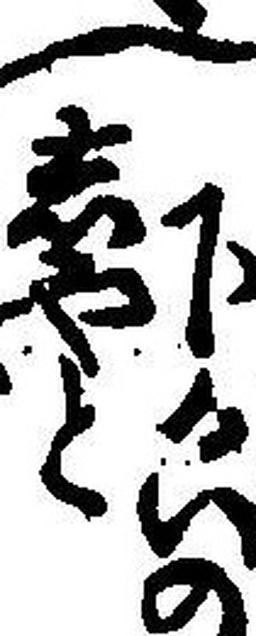しやと
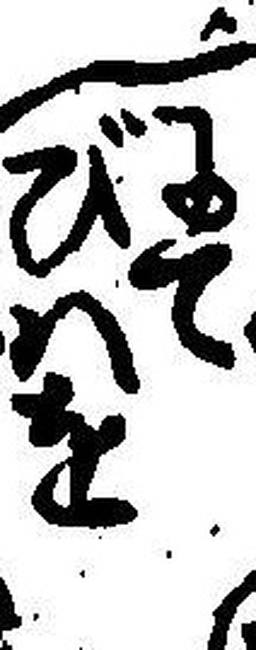びはを
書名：徳若水縁起金性 / 樹下石上作
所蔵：東京大学総合図書館 General Library in the University of Tokyo, JAPAN
